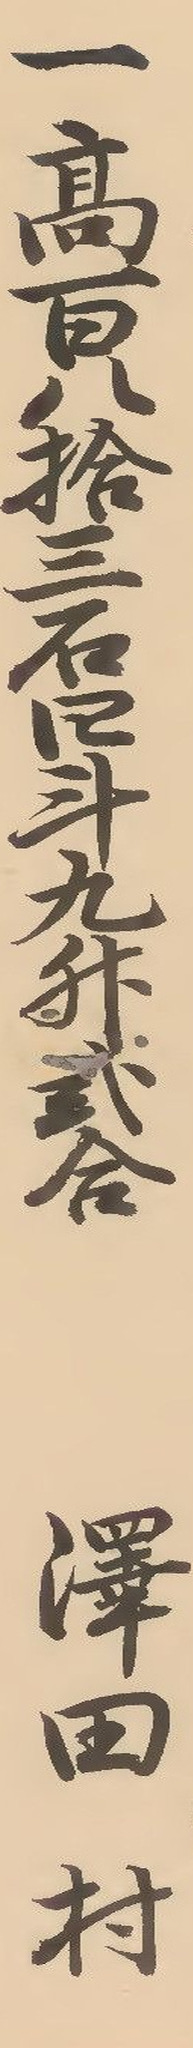一高百八拾三石四斗九升弐合沢田村

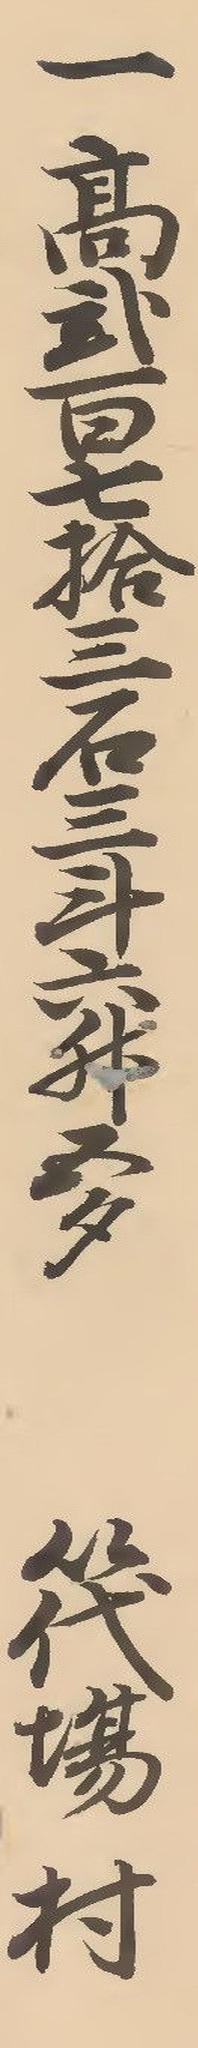一高弐百七拾三石三斗六升五勺筏場村
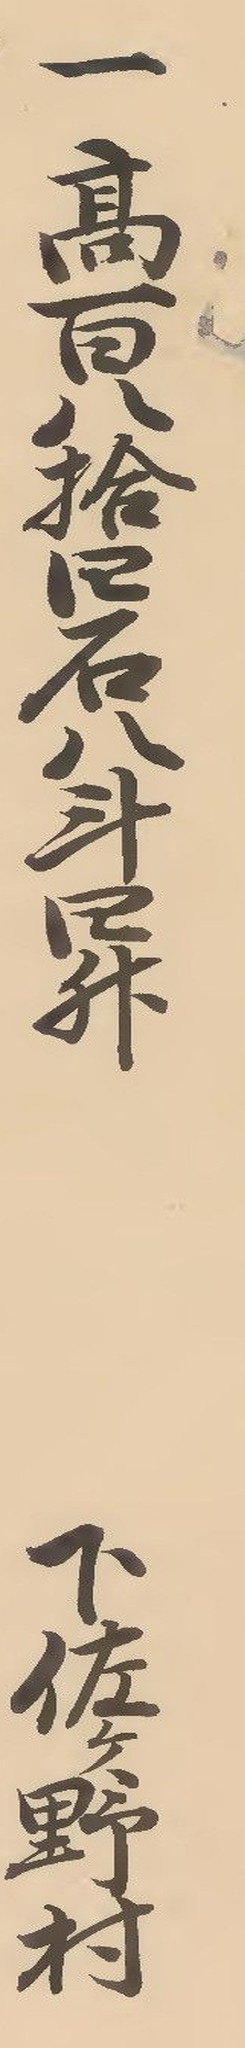一高百八拾四石八斗四升下佐ヶ野村
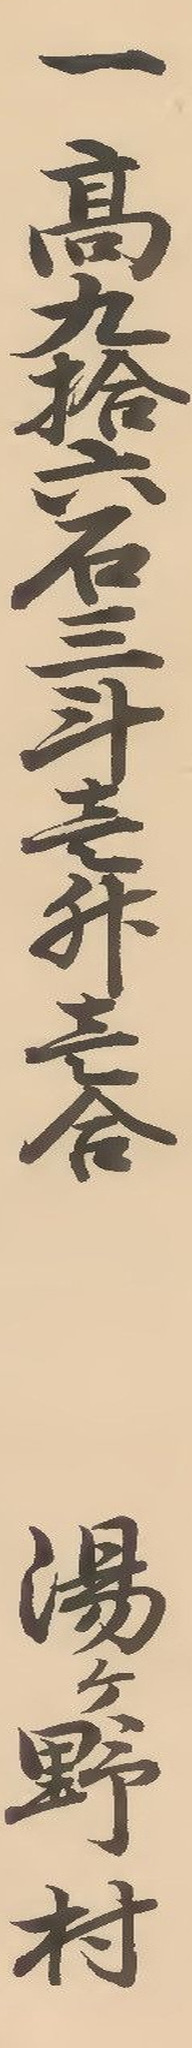一高九拾六石三斗壱升壱合湯ヶ野村
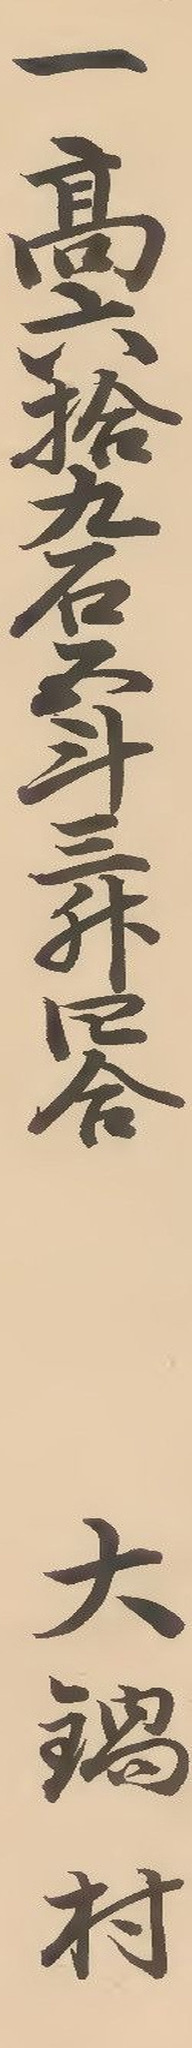一高六拾九石五斗三升四合大鍋村
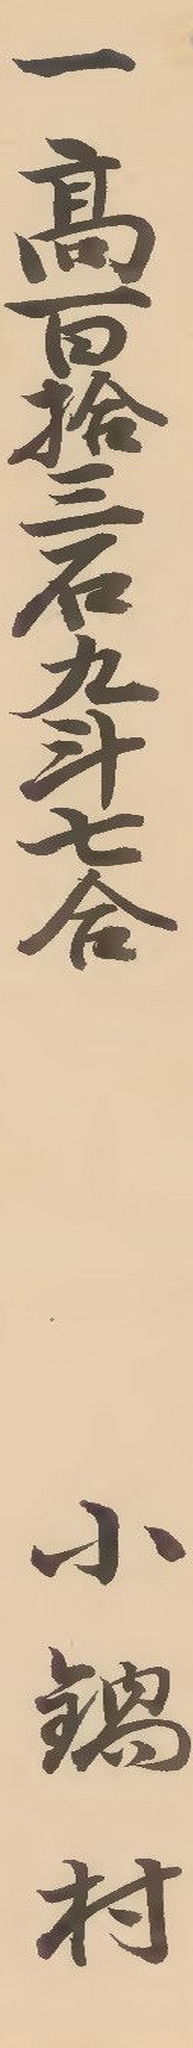一高百拾三石九斗七合小鍋村
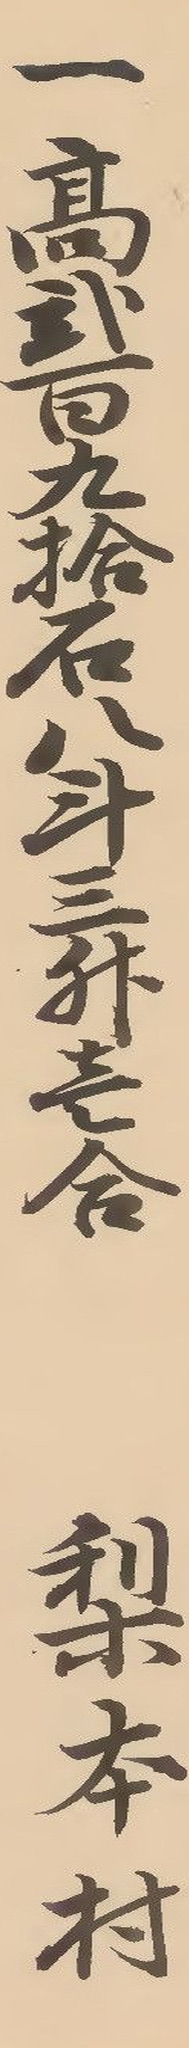一高弐百九拾石八斗三升壱合梨本村
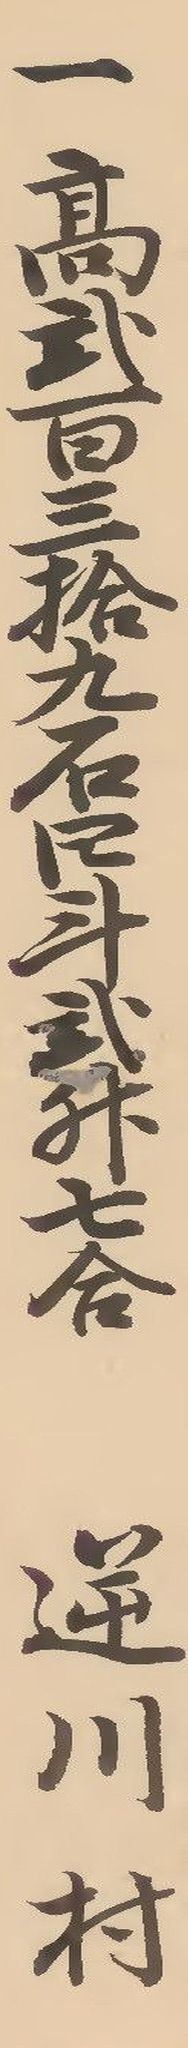一高弐百三拾九石四斗弐升七合逆川村

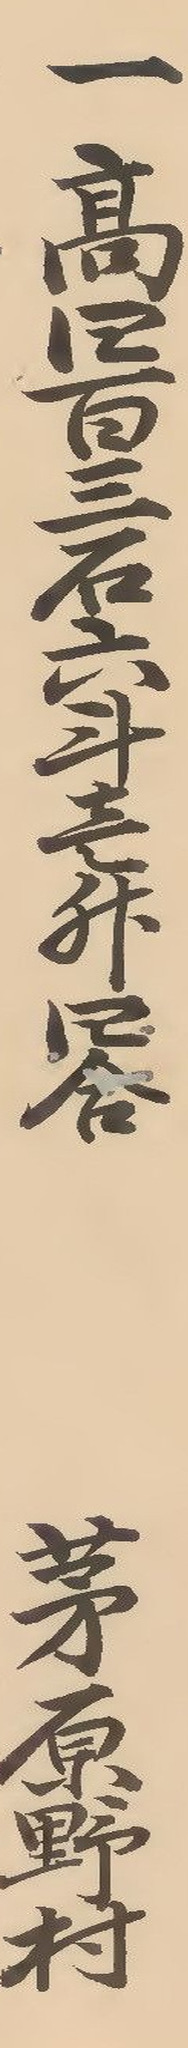一高四百三石六斗壱升四合茅原野村
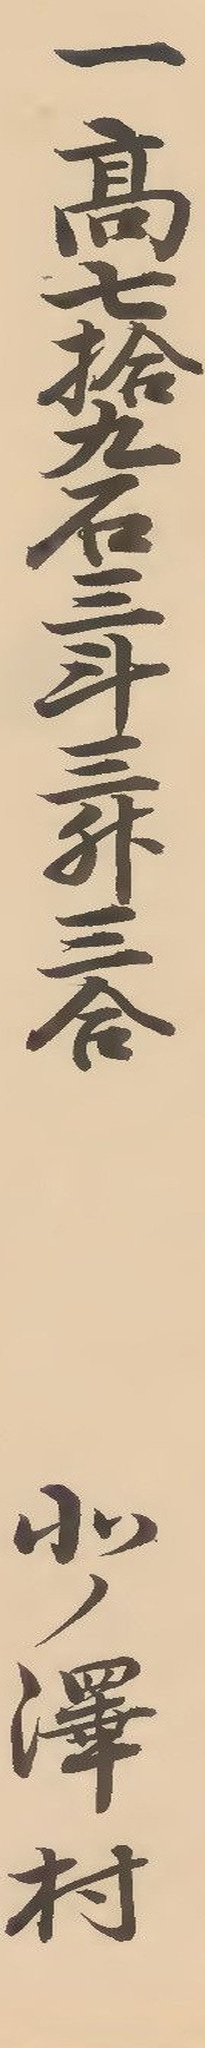一高七拾九石三斗三升三合北ノ沢村
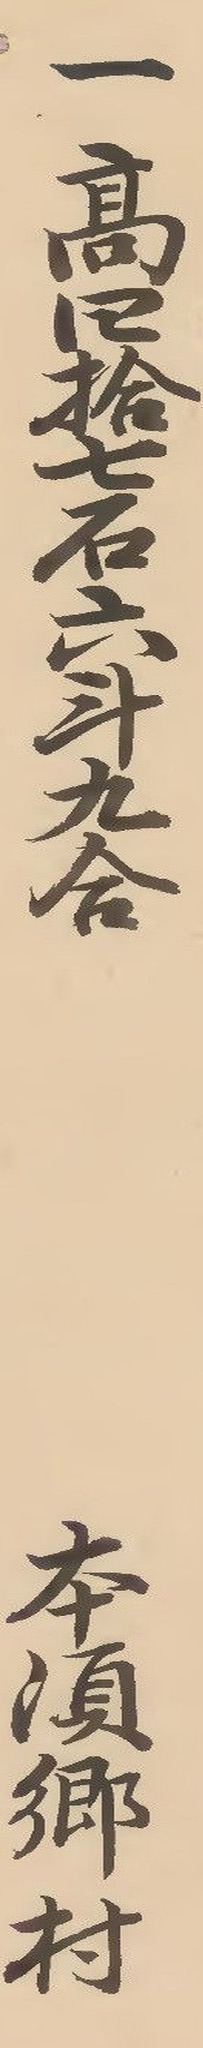一高四拾七石六斗九合本須郷村
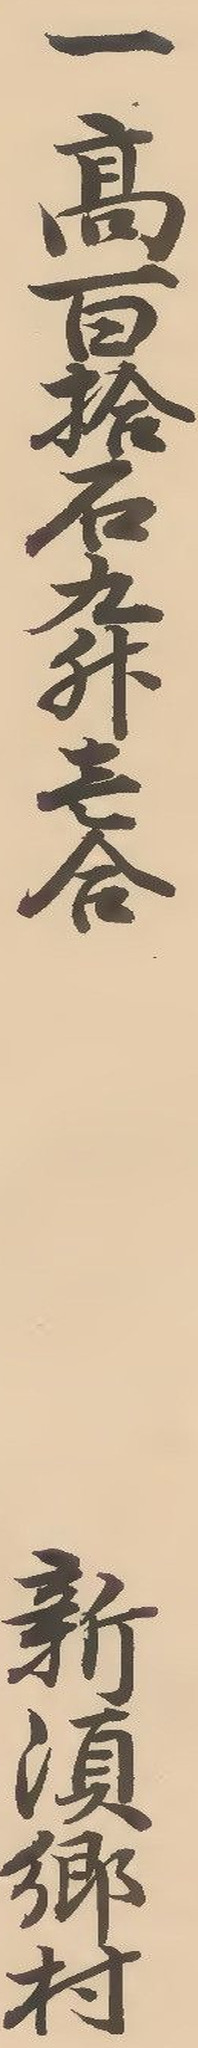一高百拾石九升壱合新須郷村
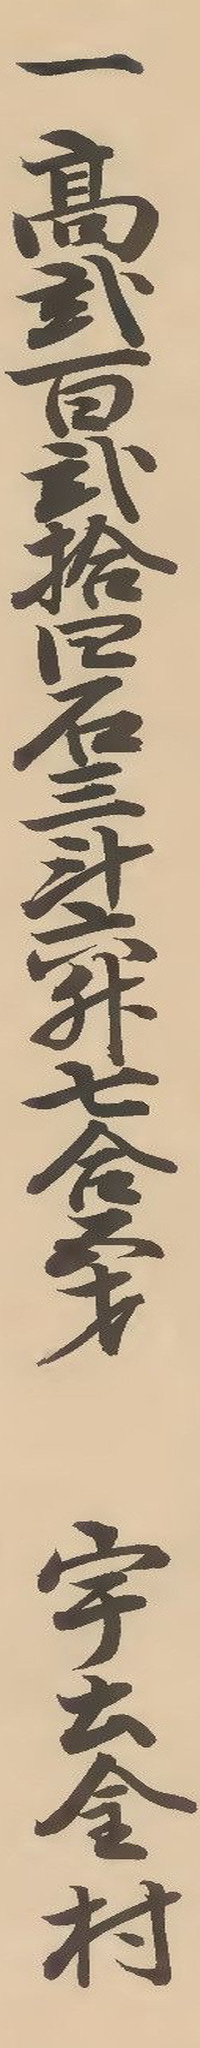一高弐百弐拾四石三斗六升七合五才宇土金村
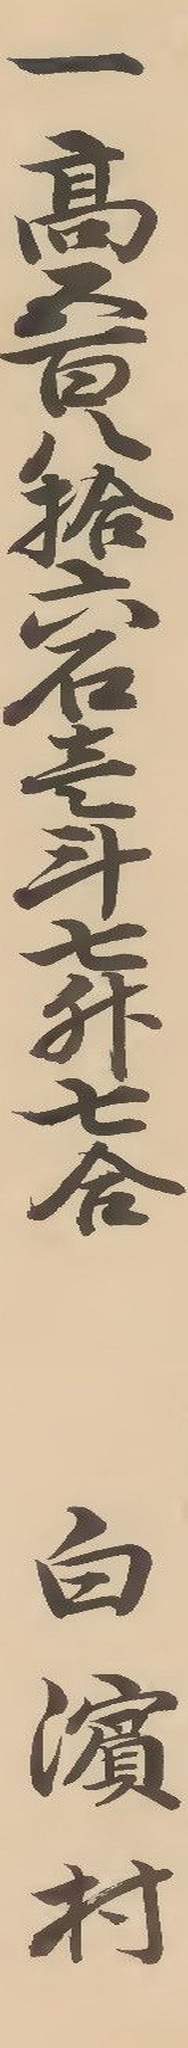一高五百八拾六石壱斗七升七合白浜村
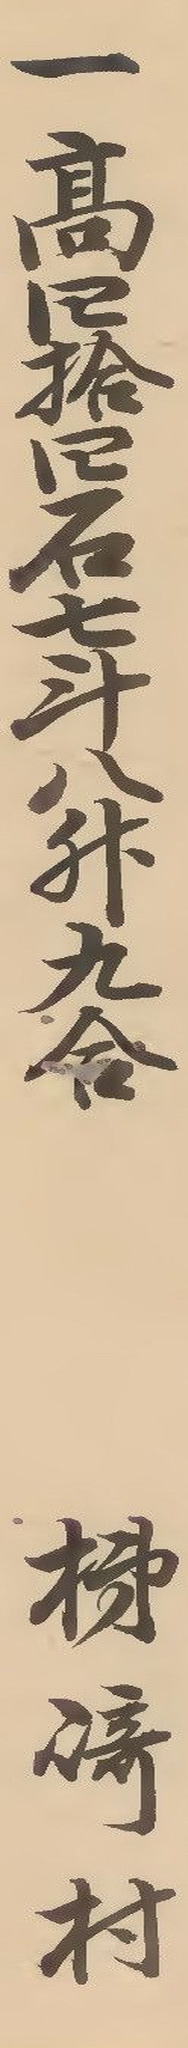一高四拾四石七斗八升九合柿崎村

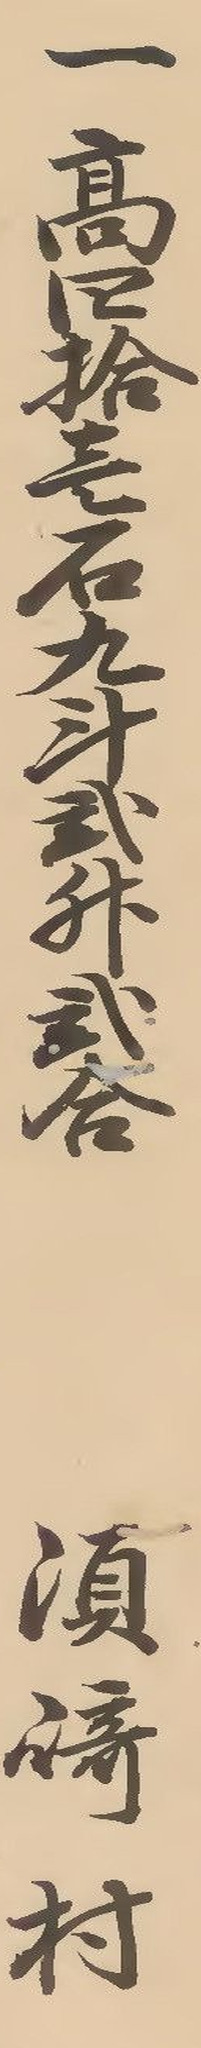一高四拾壱石九斗弐升弐合須崎村
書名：伊豆国郷帳
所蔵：国立公文書館 National Archives of Japan
